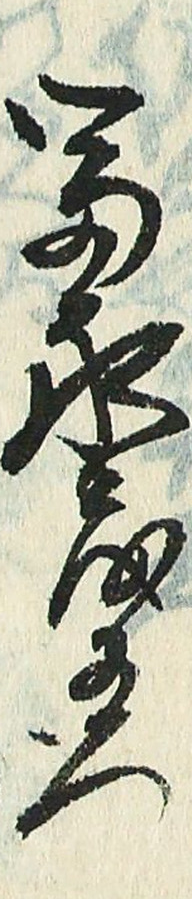富永茂右衛門
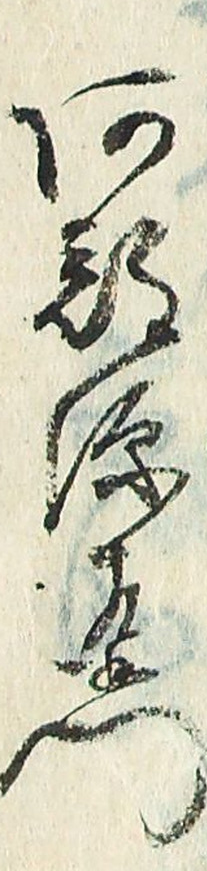阿部源左衛門

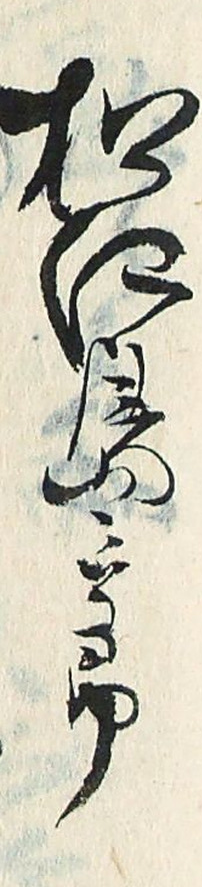松江島三郎
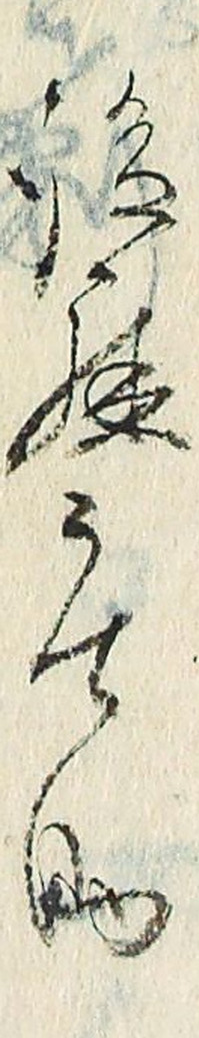後藤庄助
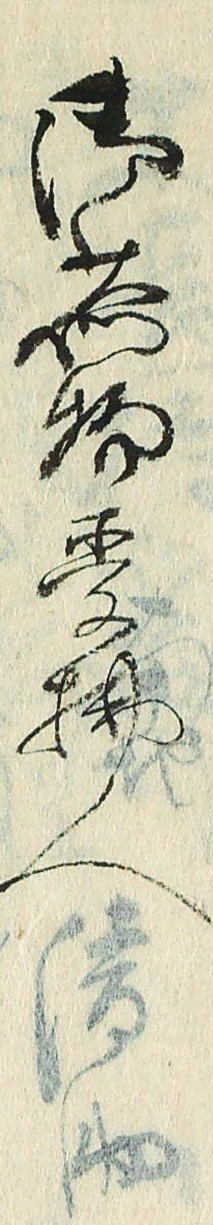御荷物受払人
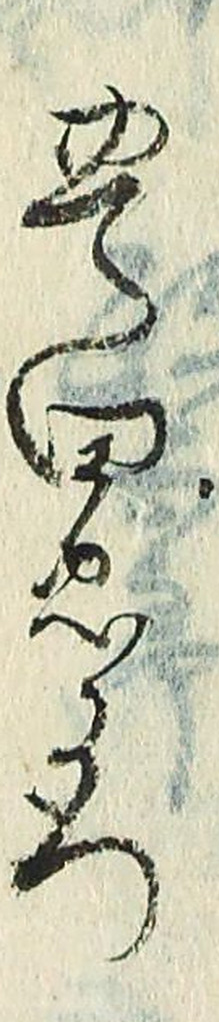同豊田忠右衛門
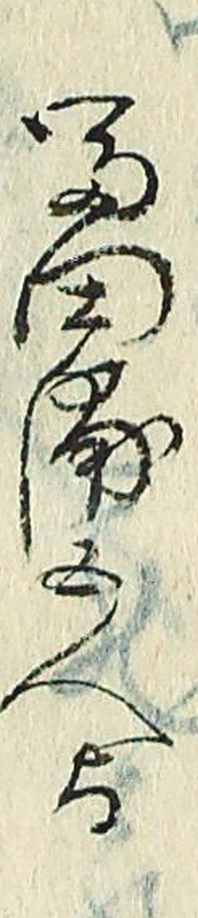富田浦五人与
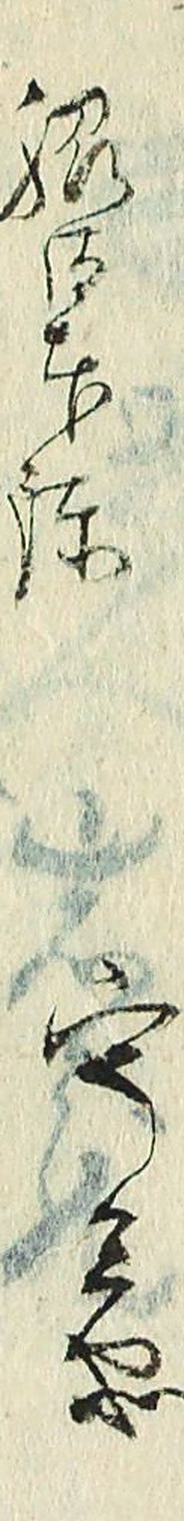脇御本陣宇兵衛
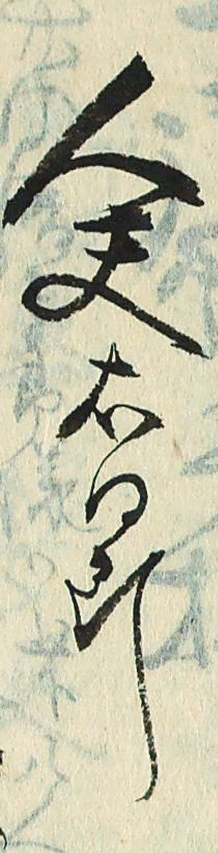人夫右同断
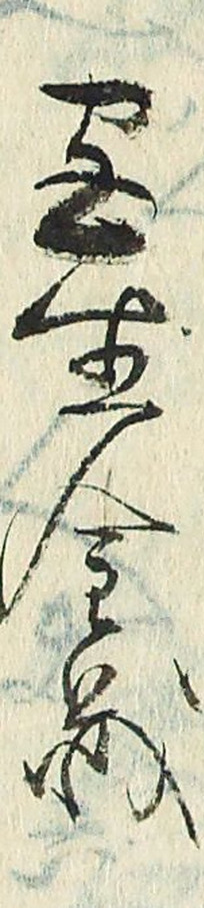宮生金蔵
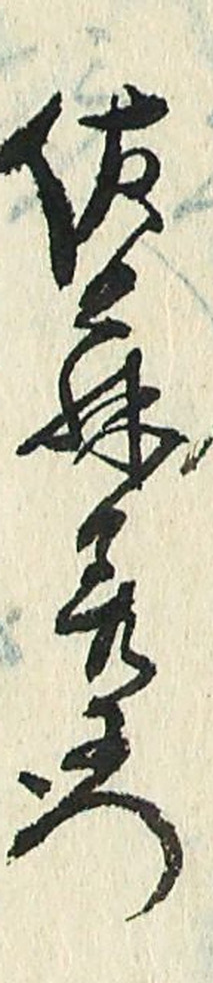佐藤善右衛門
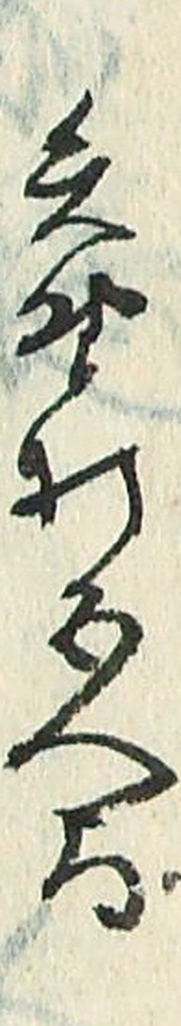矢野村五人与

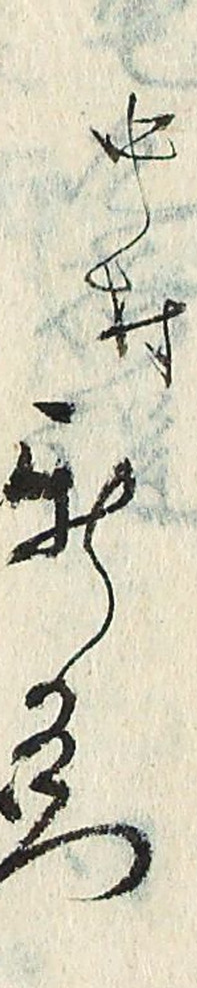中村新右衛門
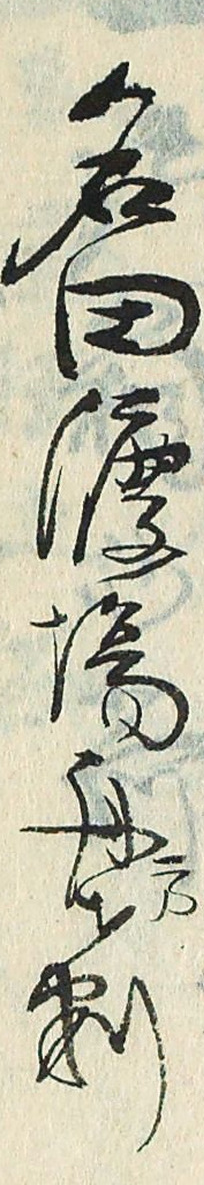名田渡場舟方才判
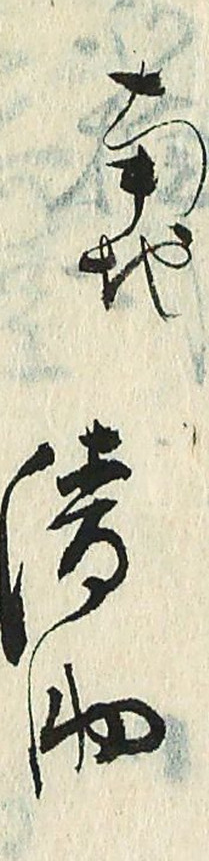南地清助
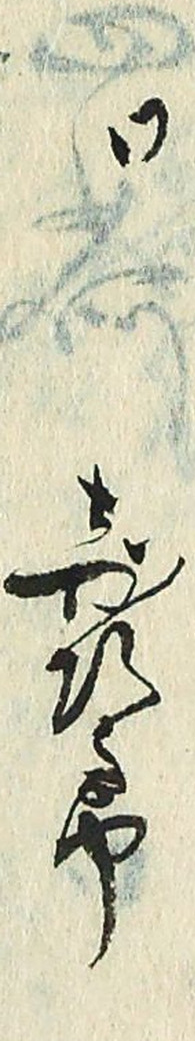同嘉次郎
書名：公辺御役人為御廻浦御立越諸御用一巻
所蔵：鳴門教育大学 Naruto University of Education
